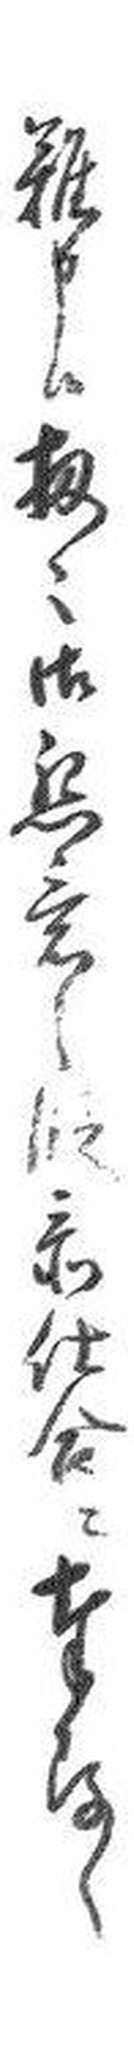難申候扨々御懇意之段忝仕合ニ奉存候
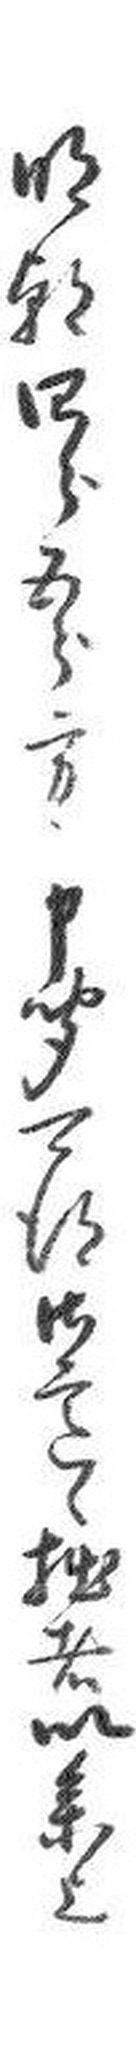明朝四郎五郎方ヘ申聞可得御意候拙者以参上
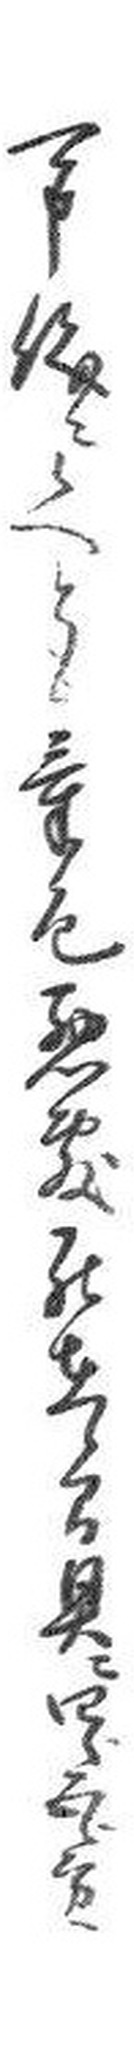可申儀ニ候ヘとも気色悪敷罷在候間具ニ四郎五郎方ヘ
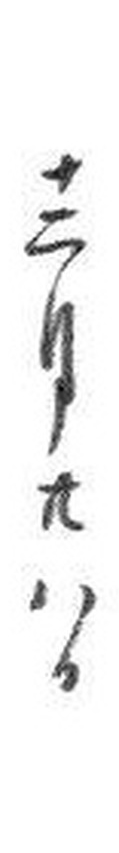十二月廿八日
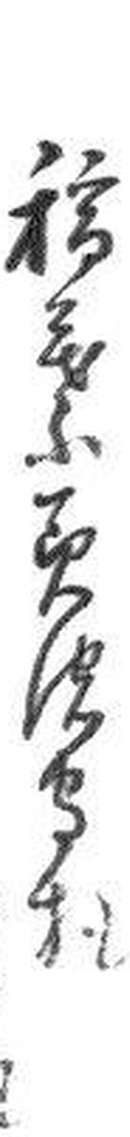稲葉美濃守様
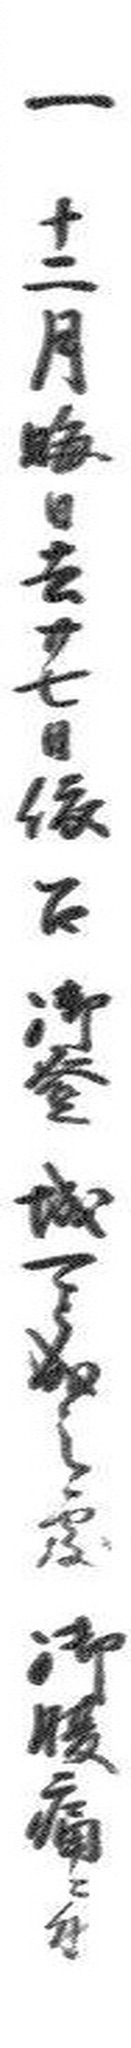一十二月晦日去廿七日依召御登城可被成之処御腹痛ニ付
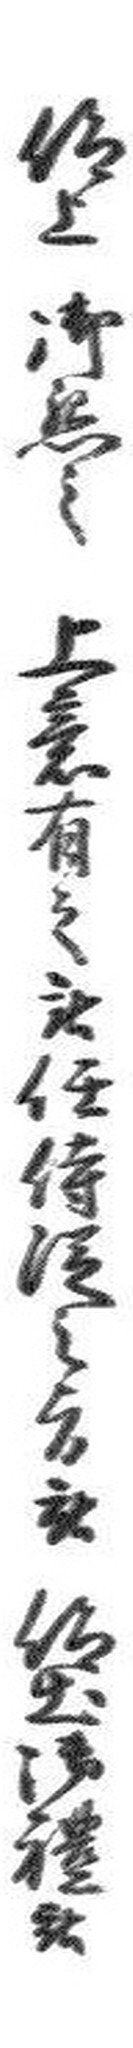仰上御懇之上意有之被任侍従之旨被仰出御礼被
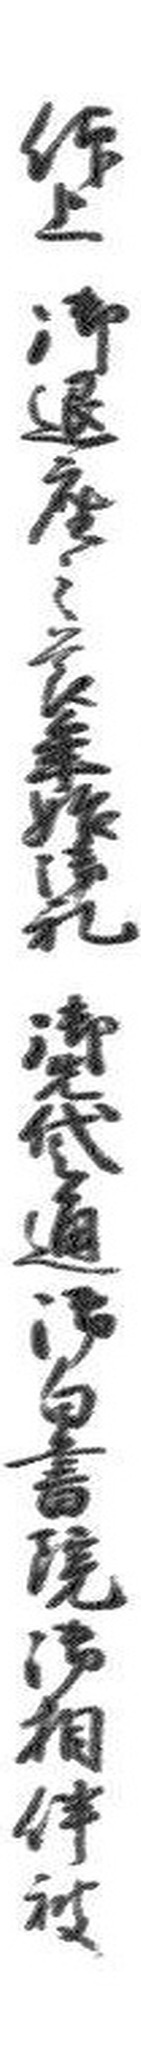仰上御退座之節年始御礼御先代之通御白書院御相伴被
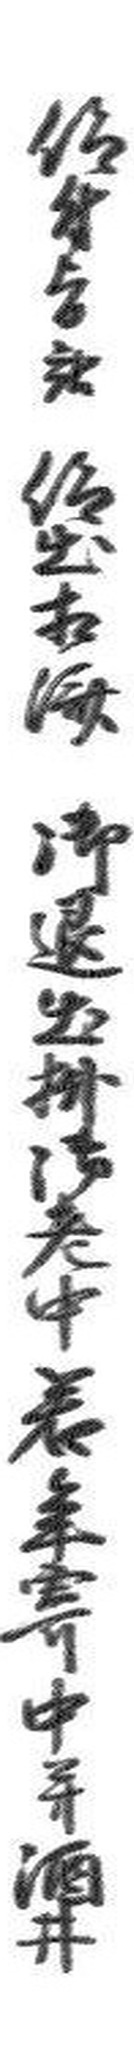仰付旨被仰出相済御退で掛御老中若年寄中并酒井
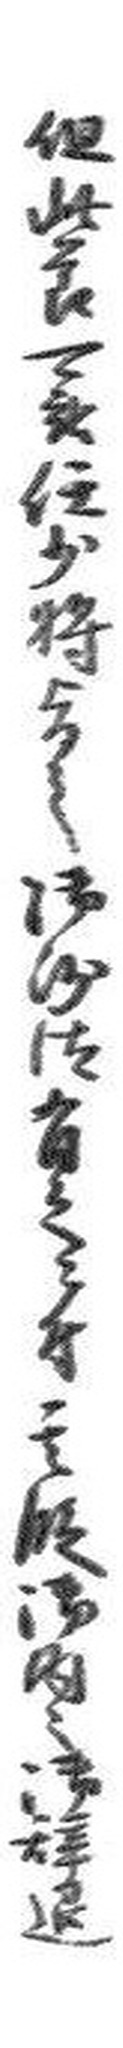但此節可被任少将旨之御沙汰有之ニ付其段御内々御辞退
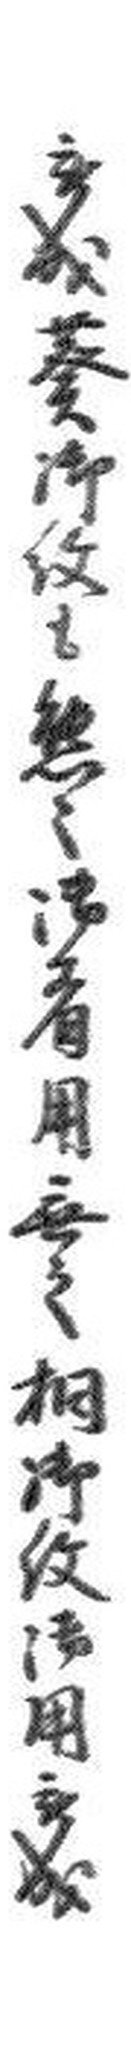被成葵御紋も態々御着用無之桐御紋御用被成

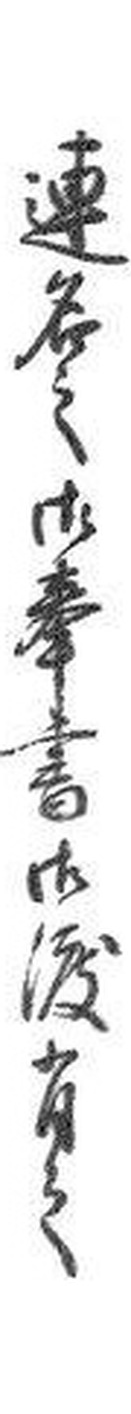連名之御奉書御渡有之
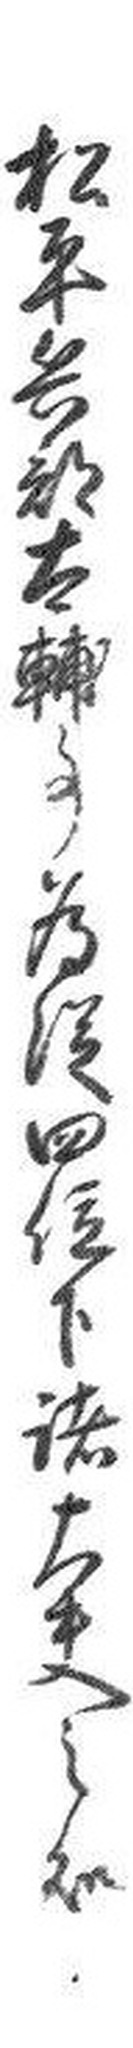松平兵部大輔事為従四位下諸大夫之処
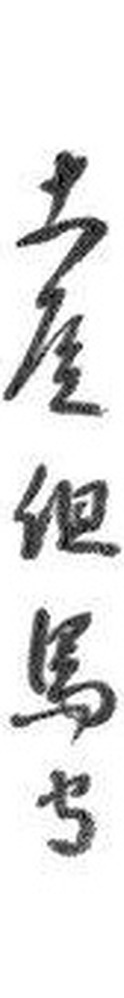土屋但馬守
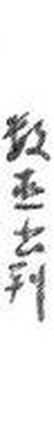数直書判
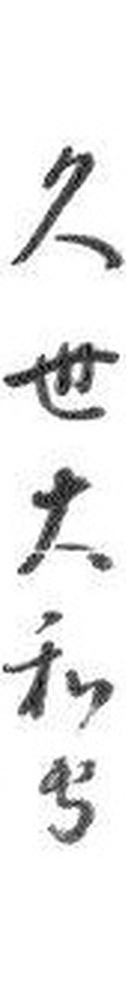久世大和守
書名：家譜 十一 昌親公 従延宝二年到延宝四年八月
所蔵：福井県文書館 Fukui Prefectural Archives
